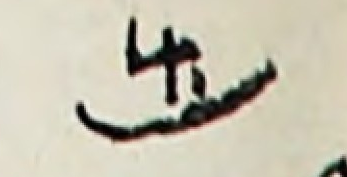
4.
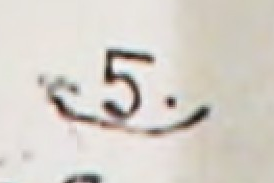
5.
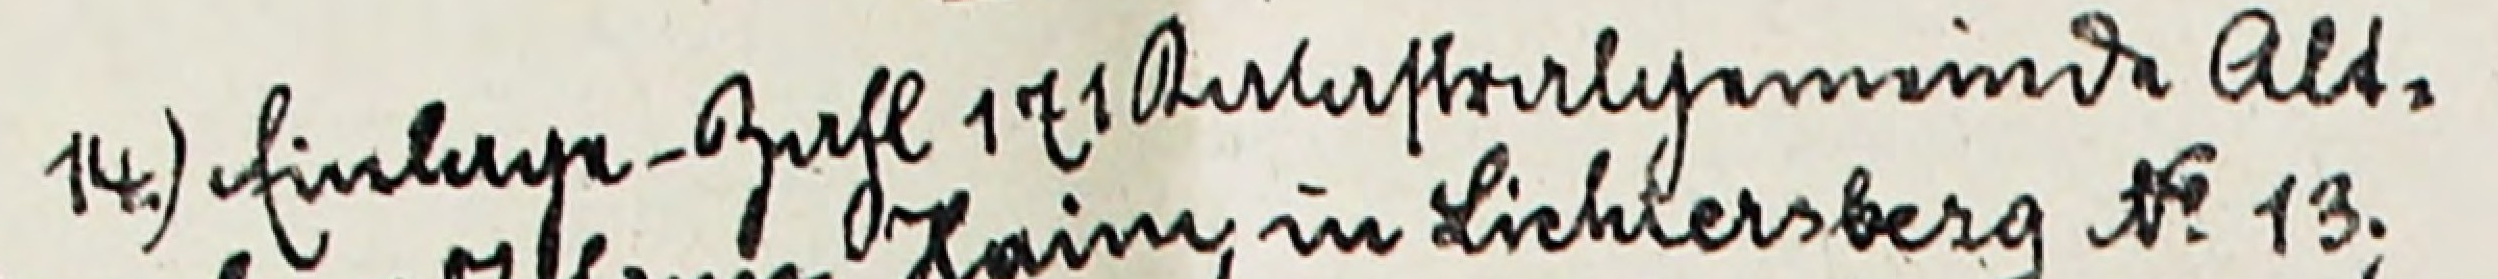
14.) Einlage - Zahl 171 Katastralgemeinde Alt=
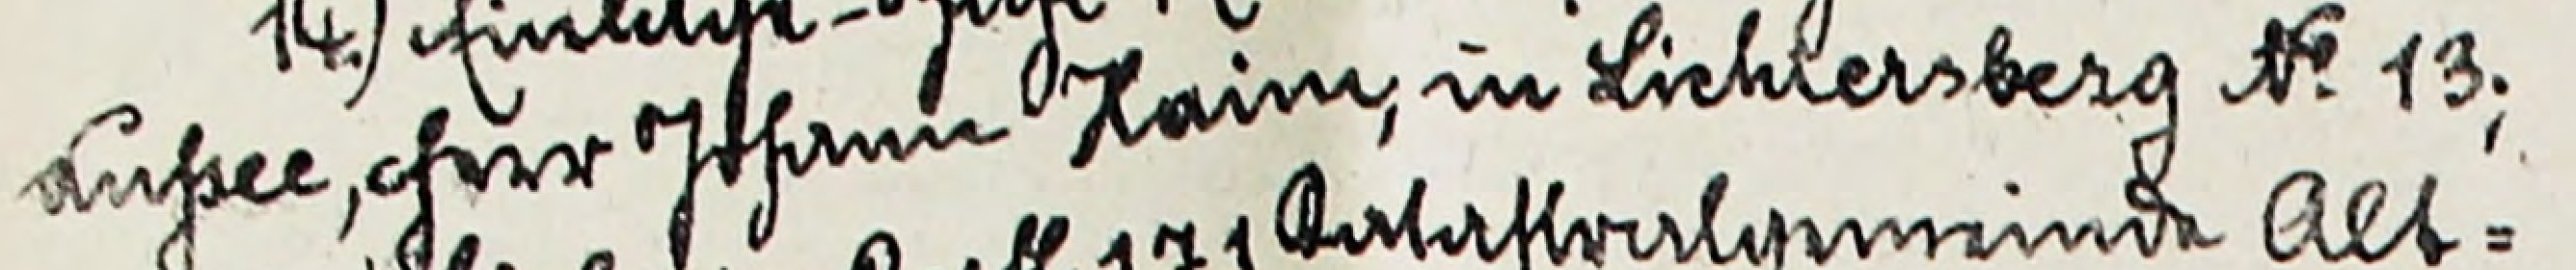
aussee, Herr Johann Haim, in Lichtersberg No 13;
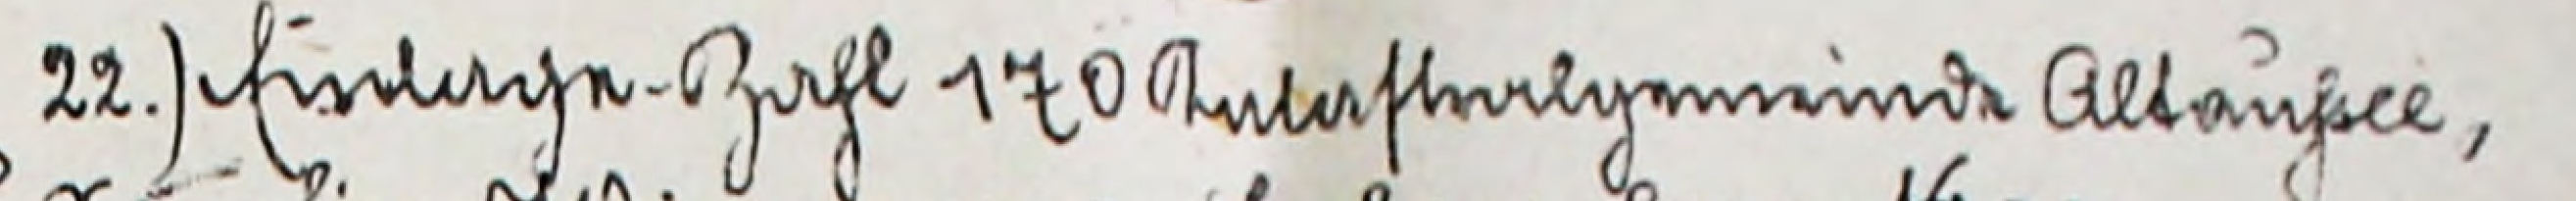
22.) Einlage - Zahl 170 Katastralgemeinde Altaussee,
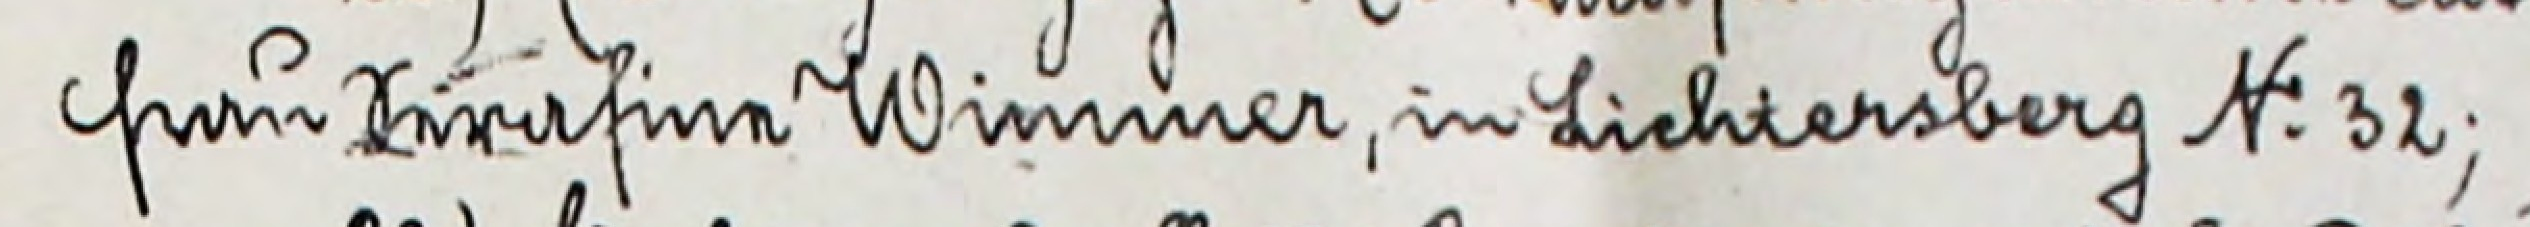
Frau Serafine Wimmer, in Lichtersberg No 32;
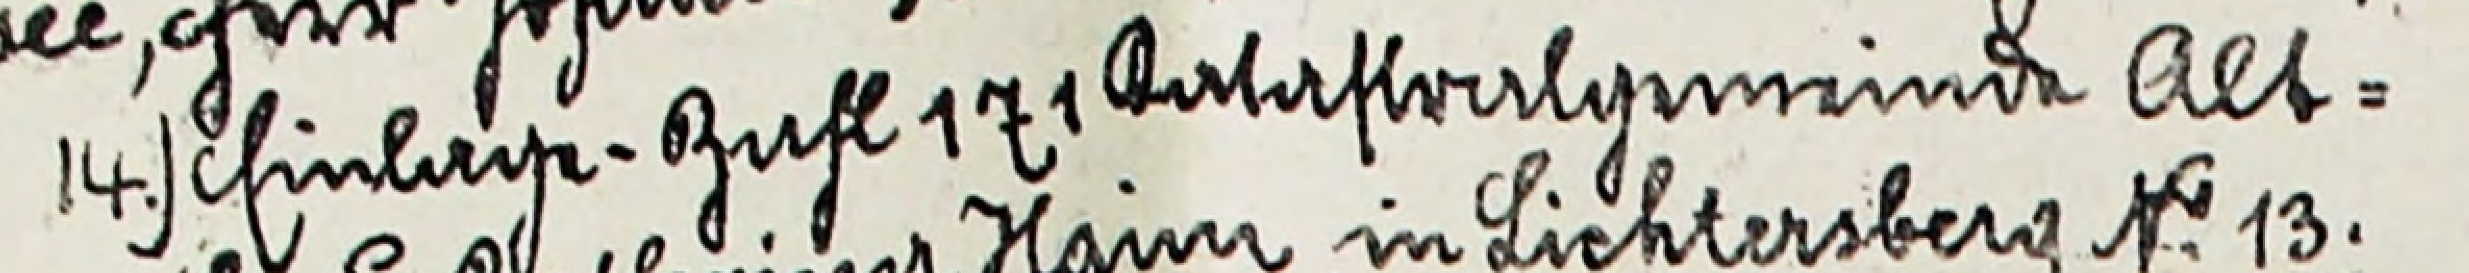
14.) Einlage - Zahl 171 Katastralgemeinde Alt=
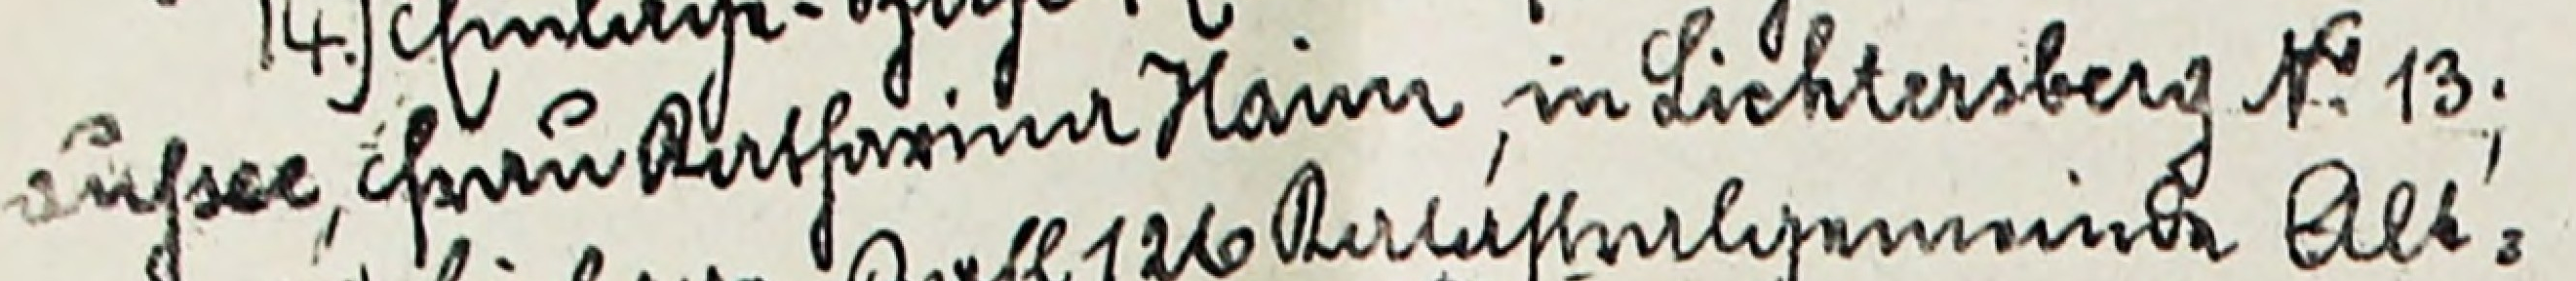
aussee, Frau Katharina Haim, in Lichtersberg No 13;
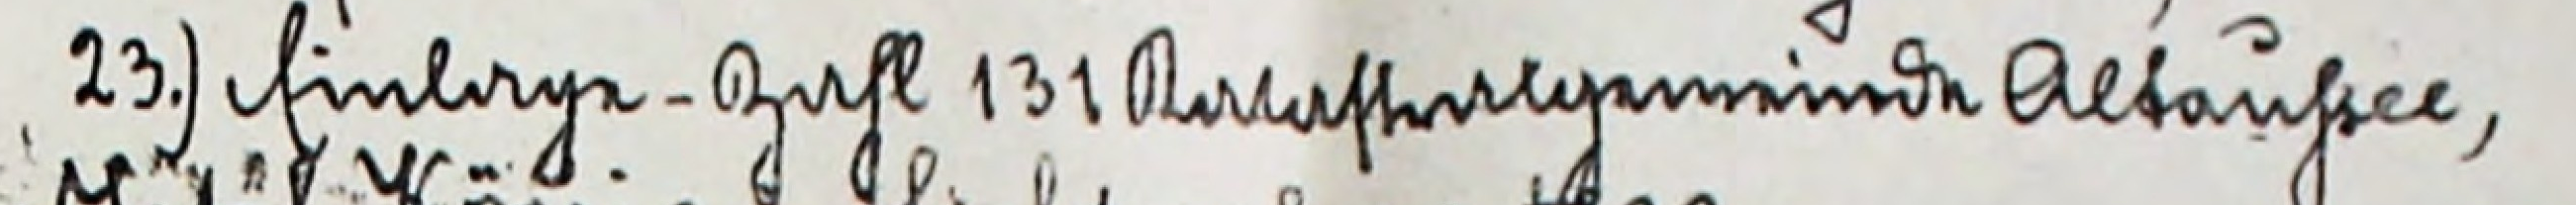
23.) Einlage - Zahl 131 Katastralgemeinde Altaussee,
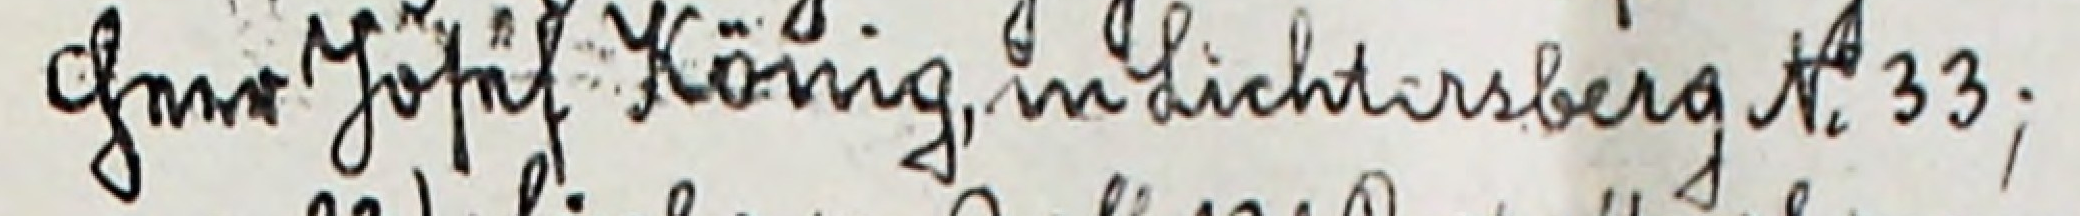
Herr Josef König, in Lichtersberg No 33;
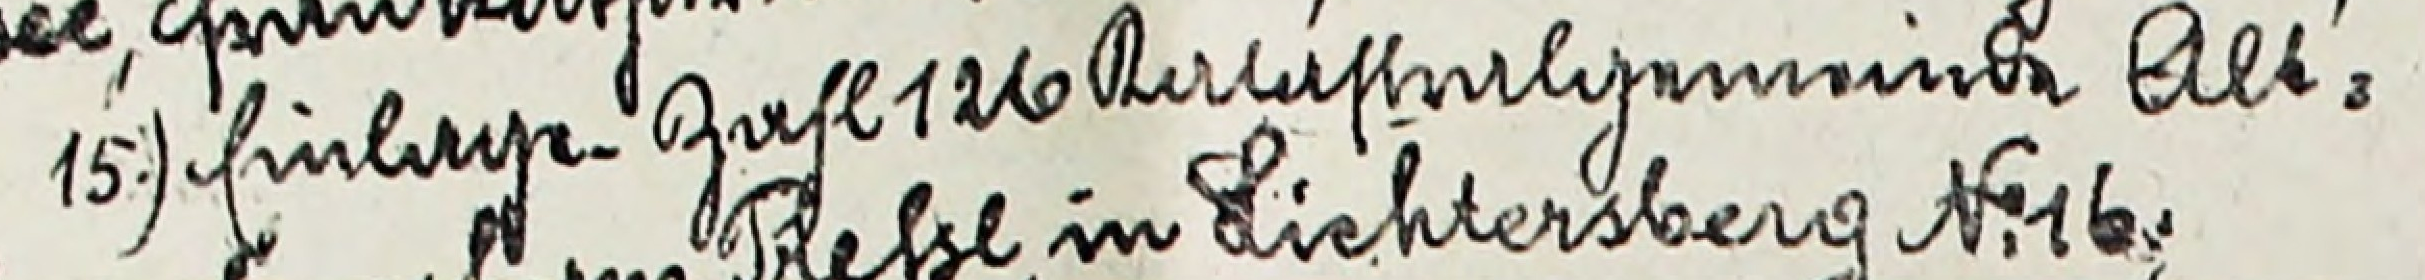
15.) Einlage - Zahl 126 Katastralgemeinde Alt=
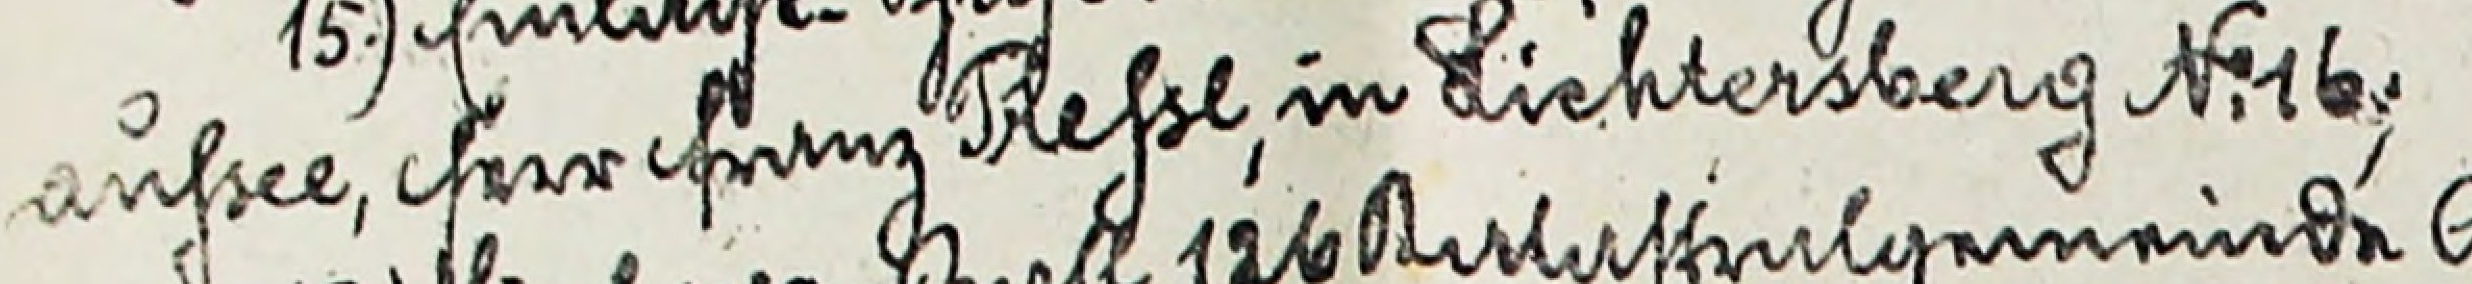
aussee, Herr Franz Pressl, in Lichtersberg No 16;
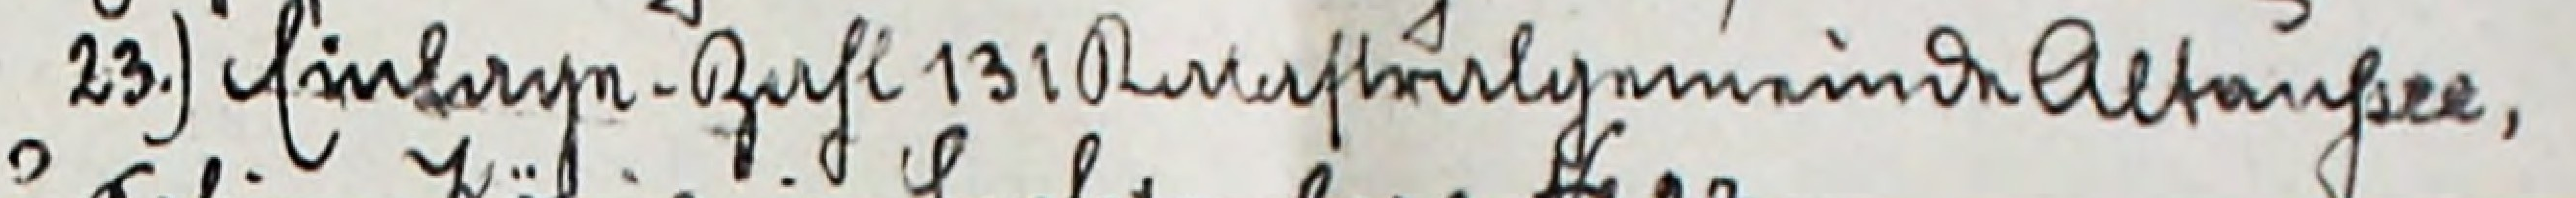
23.) Einlage - Zahl 131 Katastralgemeinde Altaussee,
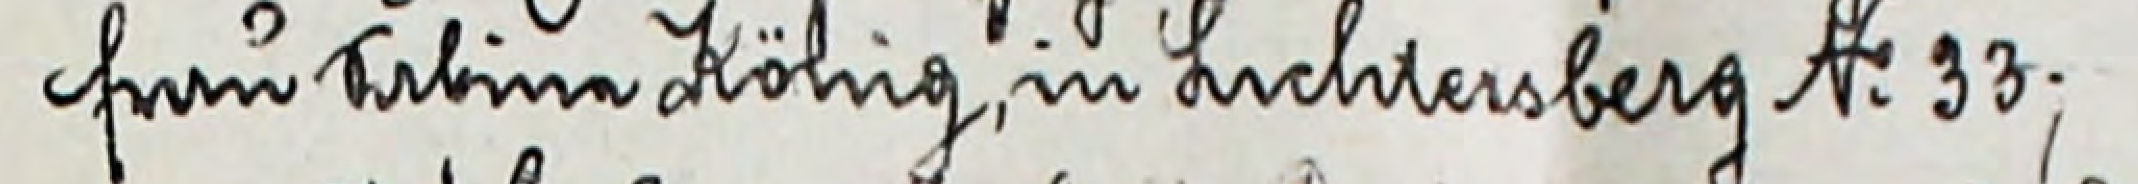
Frau Sabine König, in Lichtersberg No 33;
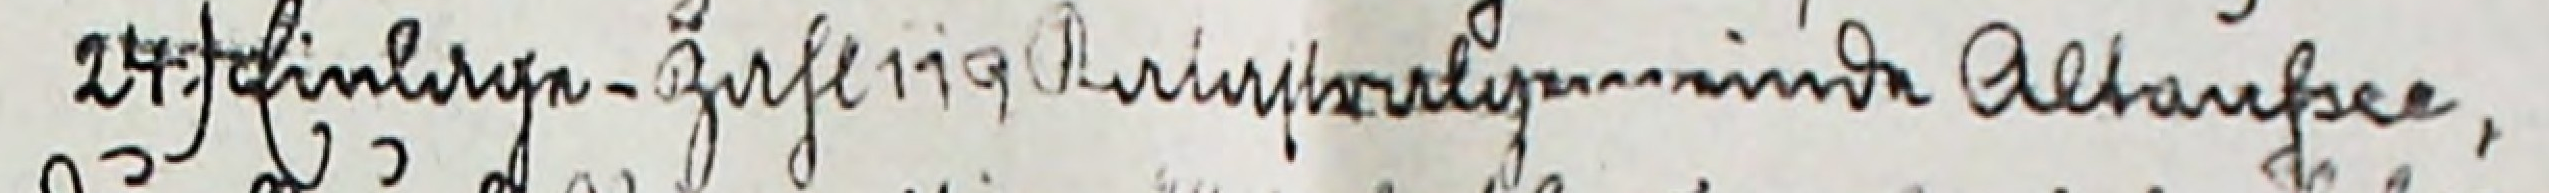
24.) Einlage - Zahl 119 Katastralgemeinde Altaussee,
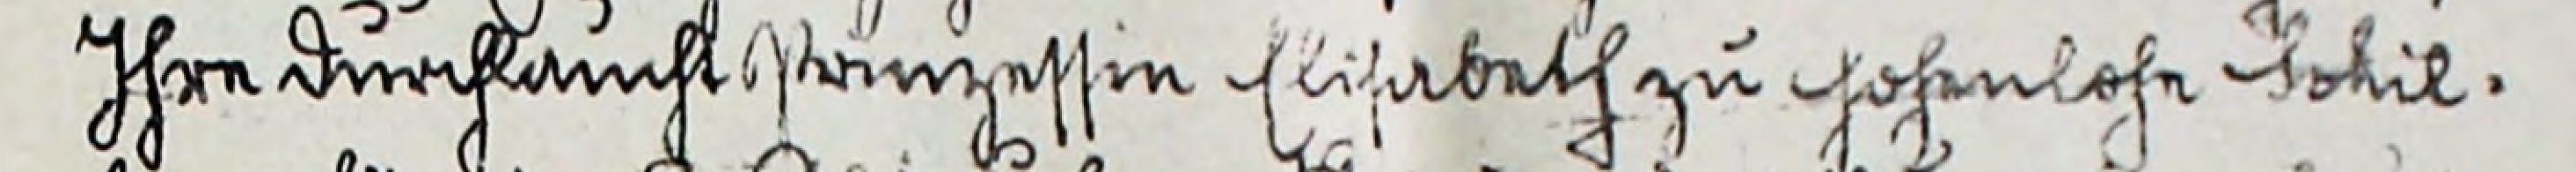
Ihre Durchlaucht Prinzessin Elisabeth zu Hohenlohe Schil=
